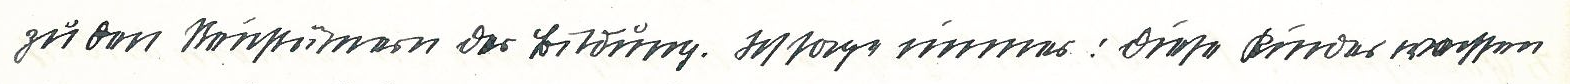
zu den Reichtümern der Bildung. Ich sage immer: Diese Kinder wachsen
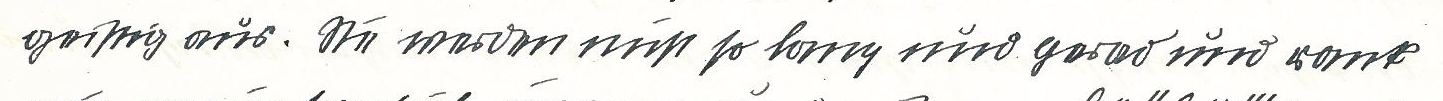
geistig aus. Sie werden nicht so lang und gerade und rank
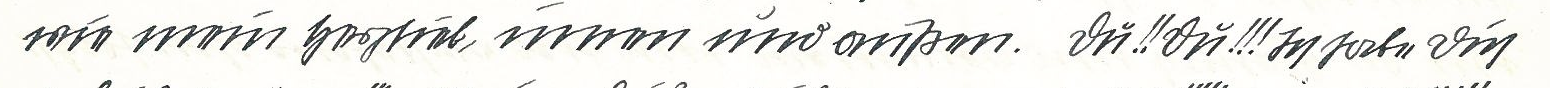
wie mein Herzlieb, innen und außen. Du!! Du!!! Ich habe Dich
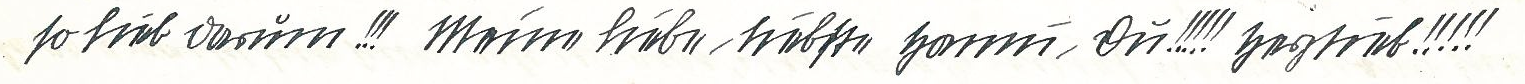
so lieb darum!!! Meine liebe, liebste, Du!!!!! Herzlieb!!!!!
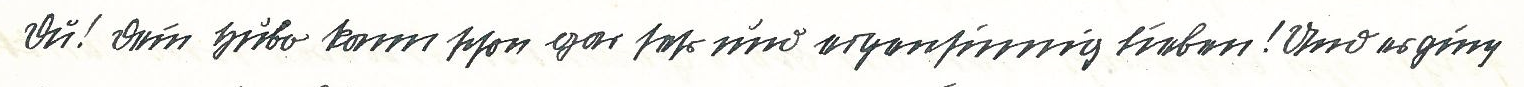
Du! Dein Hubo kann schon gar sehr und eigensinnig lieben! Und er ging
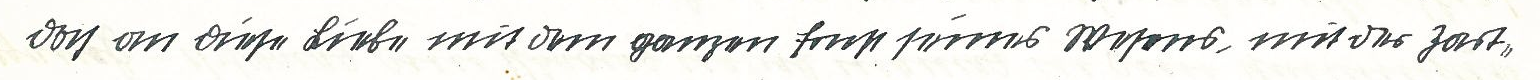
doch an diese Liebe mit dem ganzen Ernst seines Wesens, mit der Zart¬
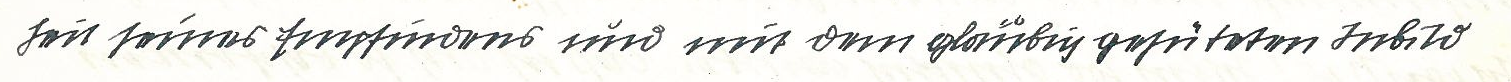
heit seines Empfindens und mit dem gläubig gehüteten Inbild
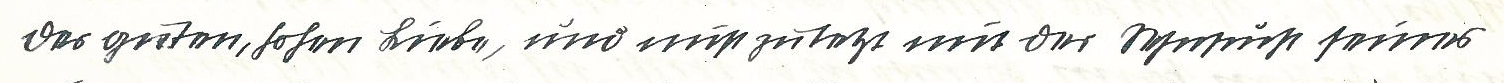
der guten, hohen, Liebe, und nicht zuletzt mit der Sehnsucht seines
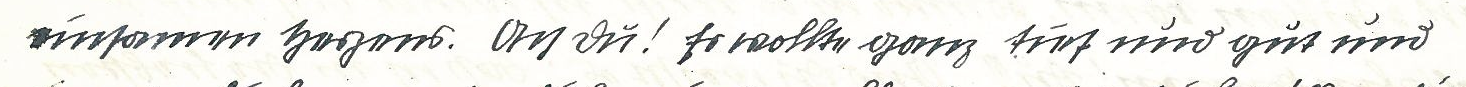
einsamen Herzens. Ach Du! Er wollte ganz tief und gut und
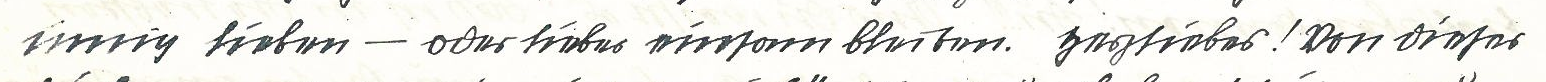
innig lieben – oder lieber einsam bleiben. Herzliebes! Von dieser
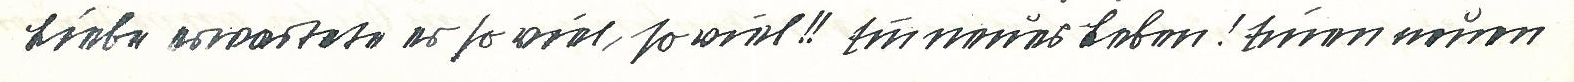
Liebe erwartete er so viel, so viel!! Ein neues Leben! Einen neuen
